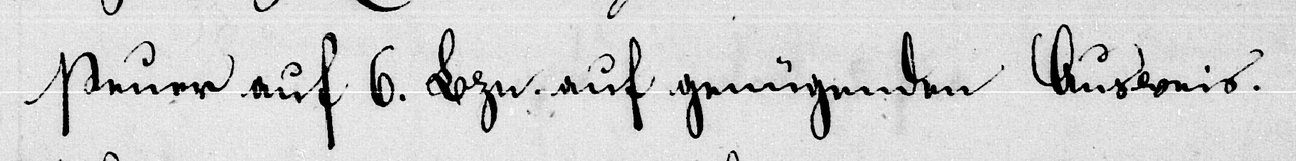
steuer auf 6. Bzn. auf genügenden Ausweis.
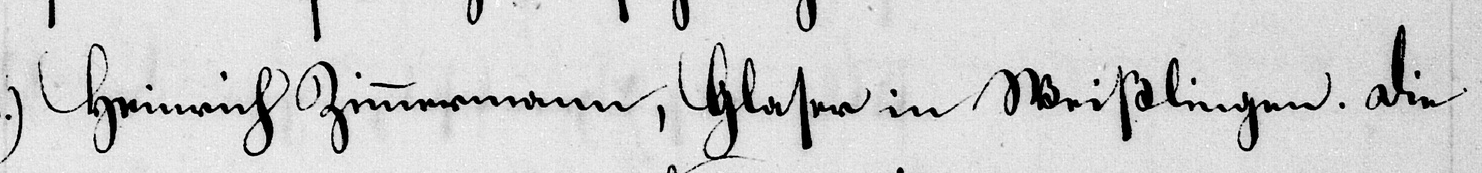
Heinrich Zimmermann, Glaser in Weißlingen. Die
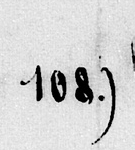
108.)
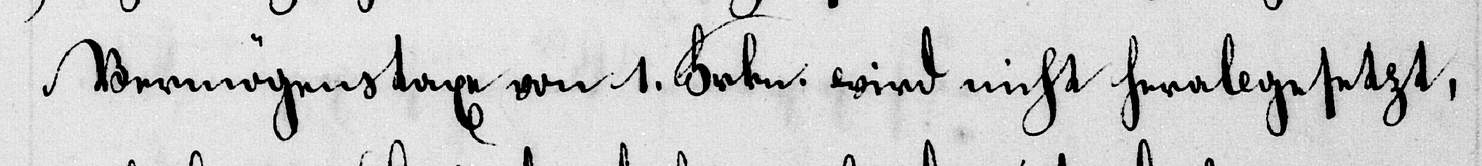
Vermögenstaxe von 1. Frkn. wird nicht herabgesetzt,
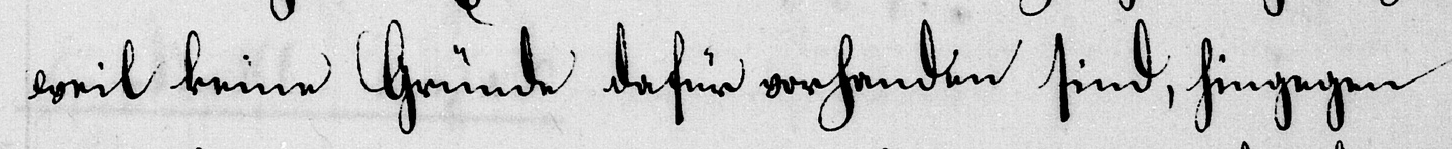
weil keine Gründe dafür vorhanden sind, hingegen
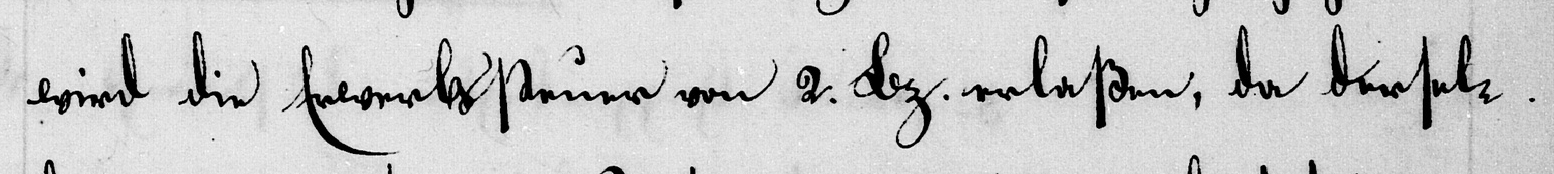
wird die Erwerbssteuer von 2. Bz. erlaßen, da dersel¬
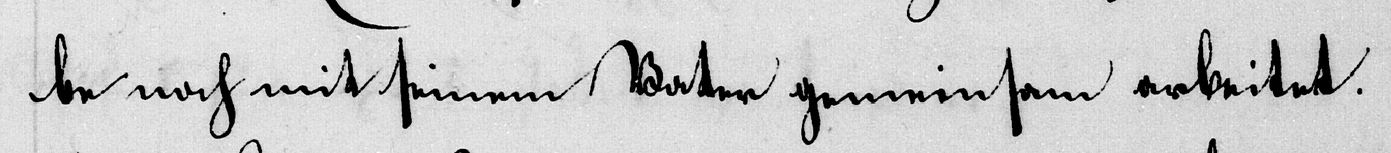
be noch mit seinem Vater gemeinsam arbeitet.
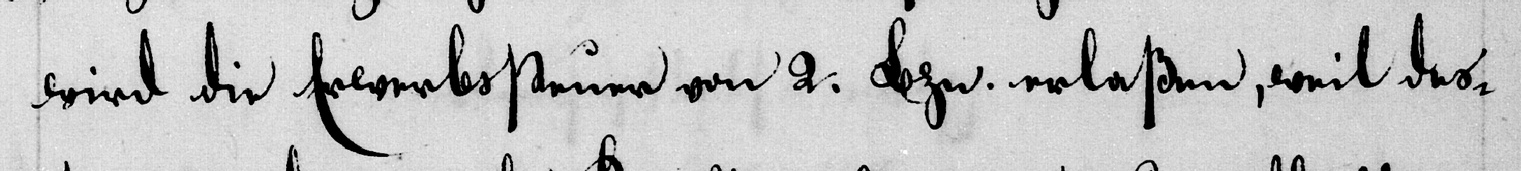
wird die Erwerbssteuer von 2. Bzn. erlaßen, weil des¬
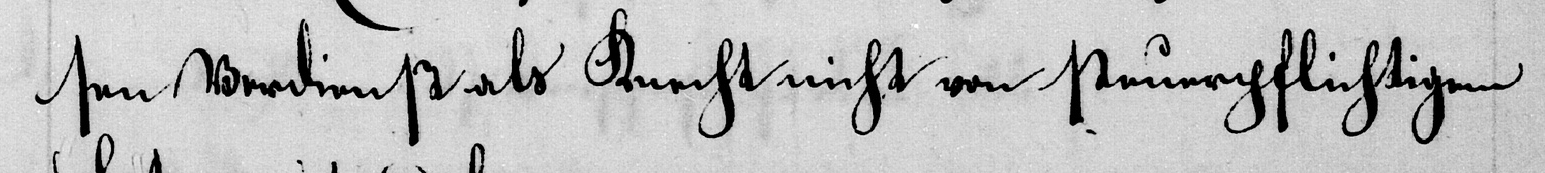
sen Verdienst als Knecht nicht von steuerpflichtigem
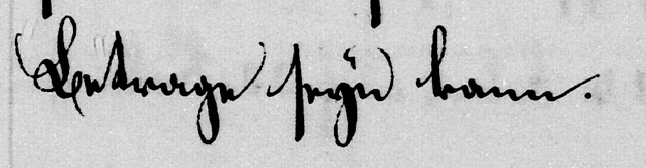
Betrage seyn kann.
